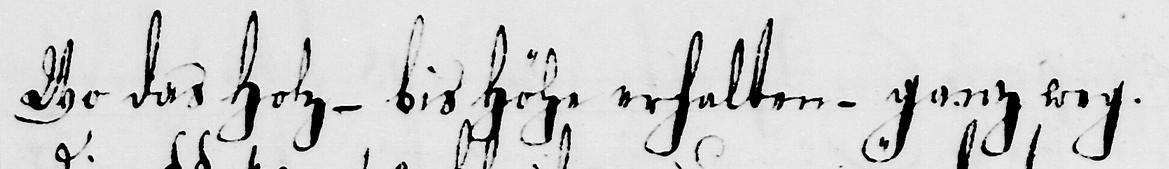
Wo das Holz – bis Höhe erhalten – ganz weg.
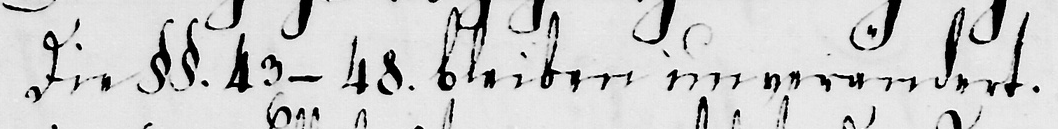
Die §§. 43. – 48. bleiben unverändert.
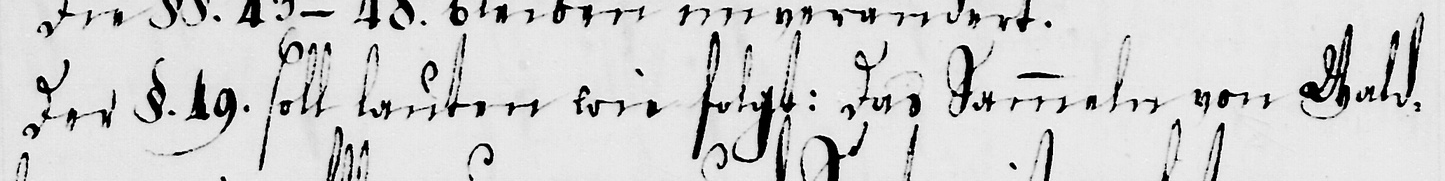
Der § 49. soll lauten wie folgt: Das Sammeln von Wald¬
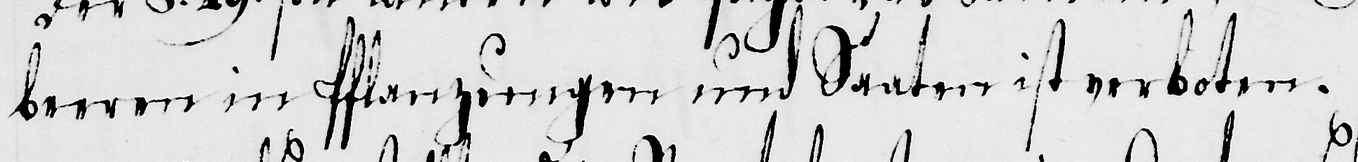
beeren in Pflanzungen und Saaten ist verboten.
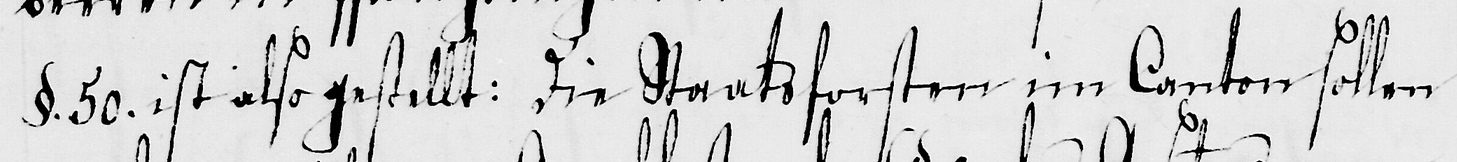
§. 50. ist also gestellt: Die Staatsforsten im Canton sollen
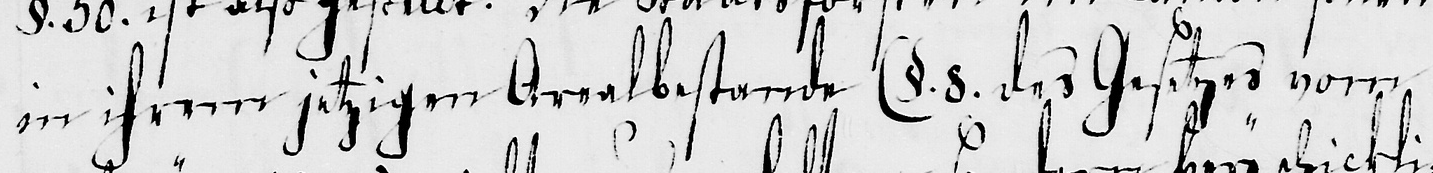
in ihrem jetzigen Arealbestande (§. 8. des Gesetzes vom
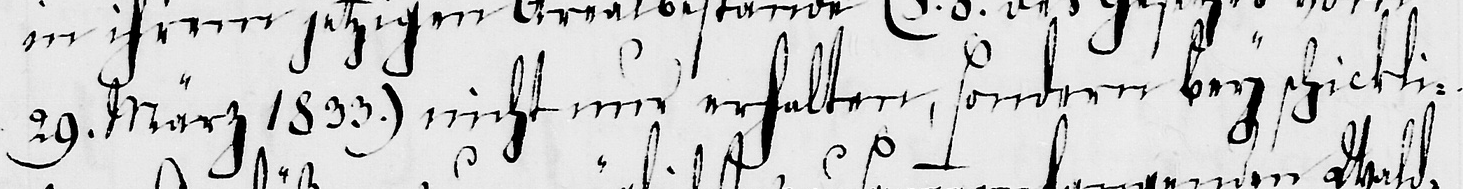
29. März 1833.) nicht nur erhalten, sondern bey schickli¬
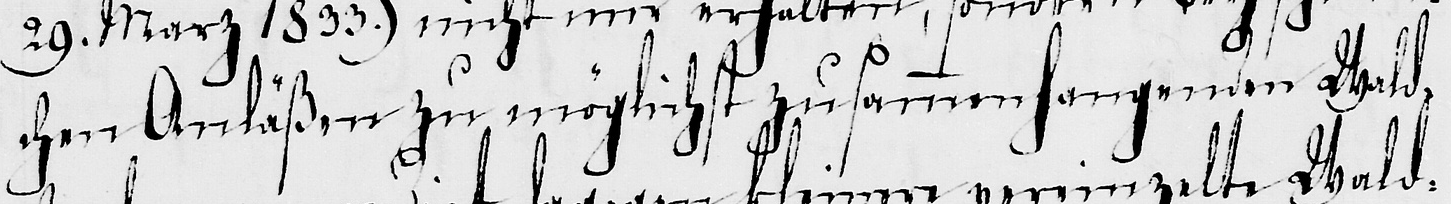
chen Anläßen zu möglichst zusammenhangenden Wald¬
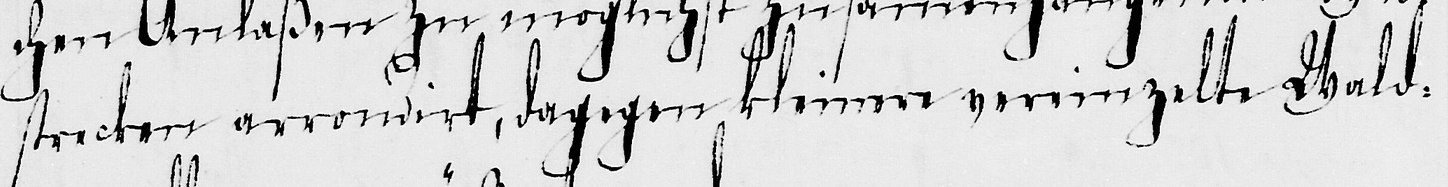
strecken arrondirt, dagegen kleinere vereinzelte Wald¬
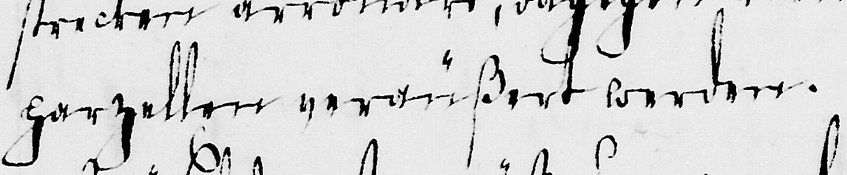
parzellen veräußert werden.
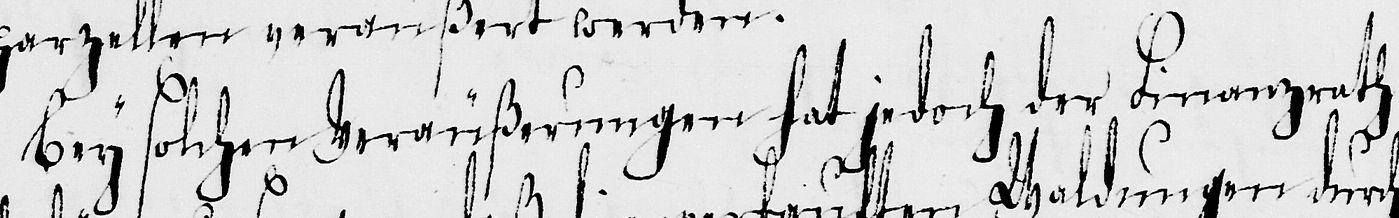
Bey solchen Veräußerungen hat jedoch der Finanzrath
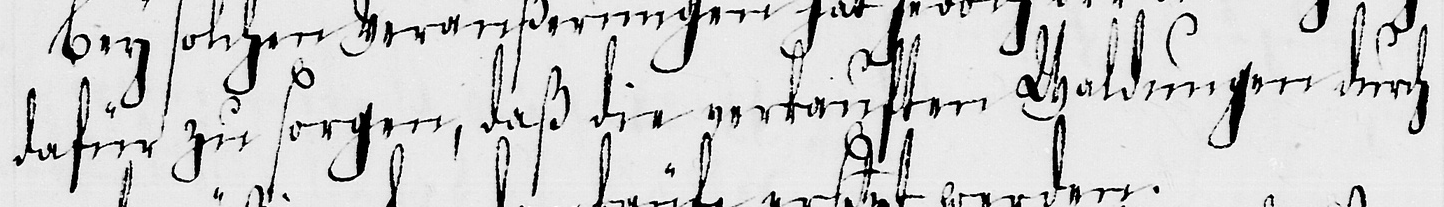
dafür zu sorgen, daß die verkauften Waldungen durch
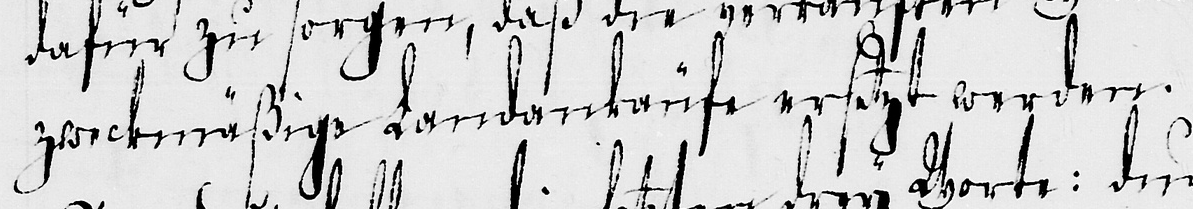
zweckmäßige Landankäufe ersetzt werden.
